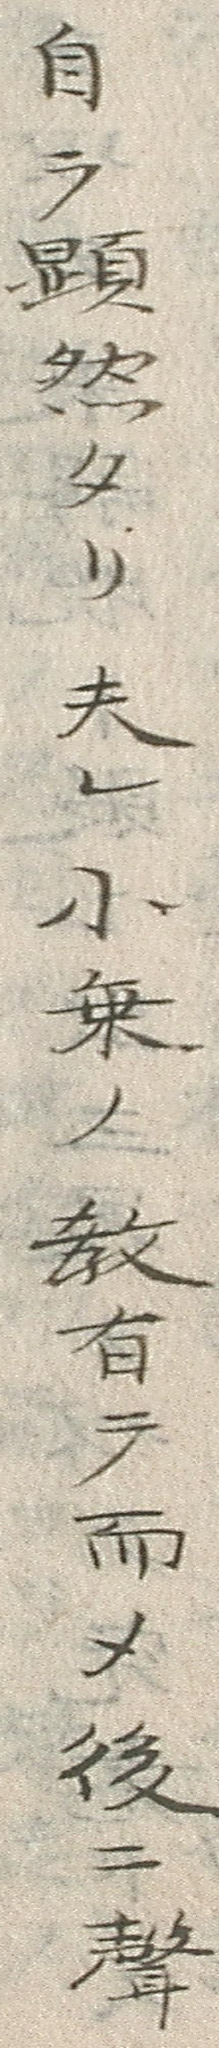自ラ顕然タリ夫レ小乗ノ教有テ而シテ後ニ声
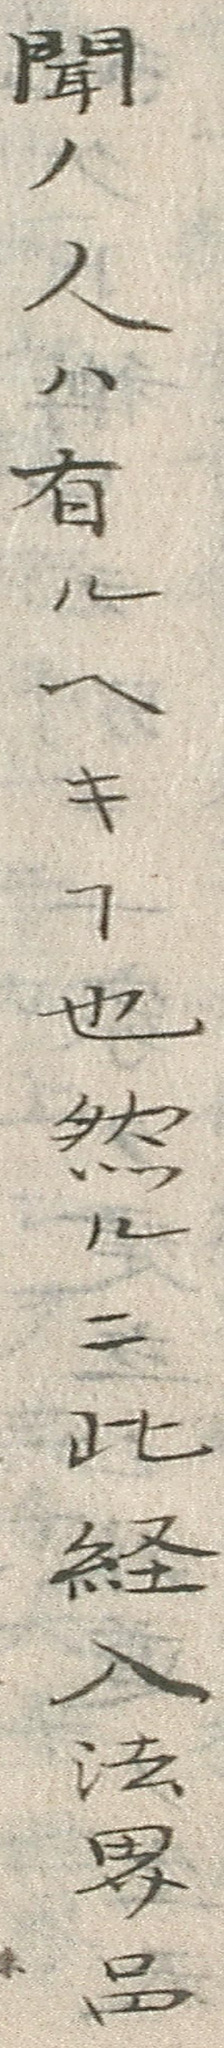聞ノ人ハ有ルヘキコト也然ルニ此経入法界品
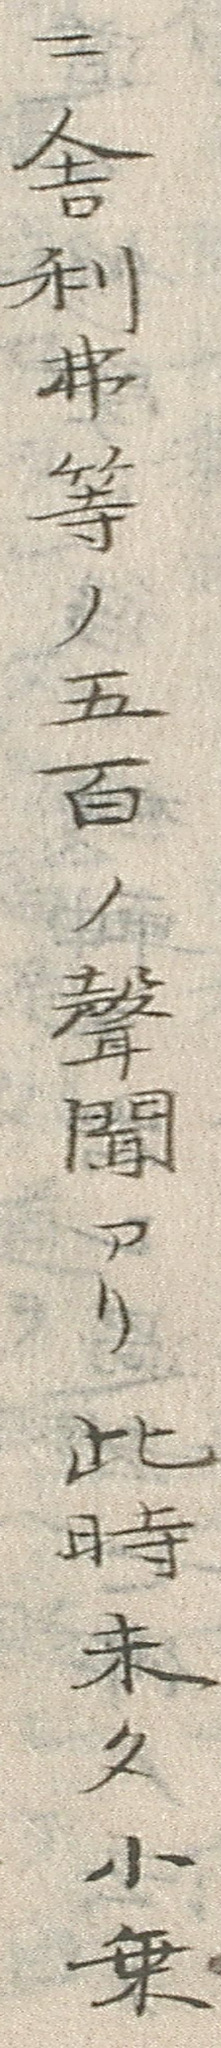ニ舎利仏等ノ五百ノ声聞アリ此時未タ小乗
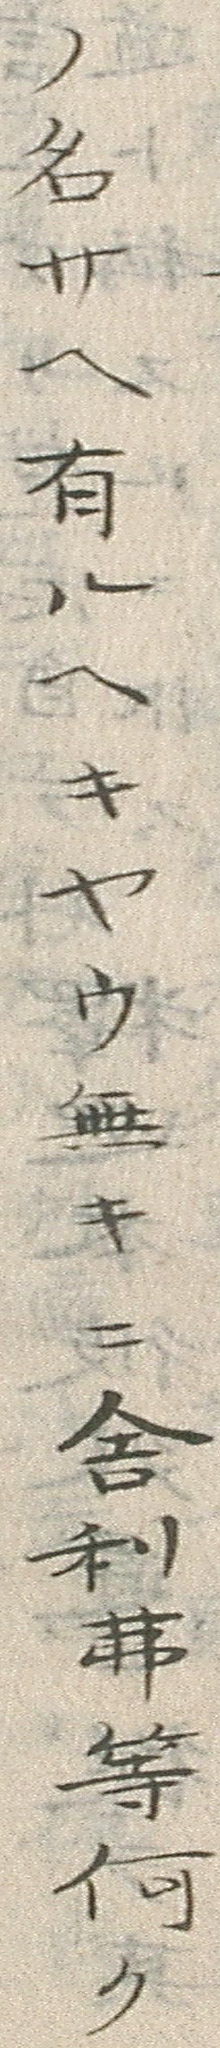ノ名サヘ有ルヘキヤウ無キニ舎利仏等何ク
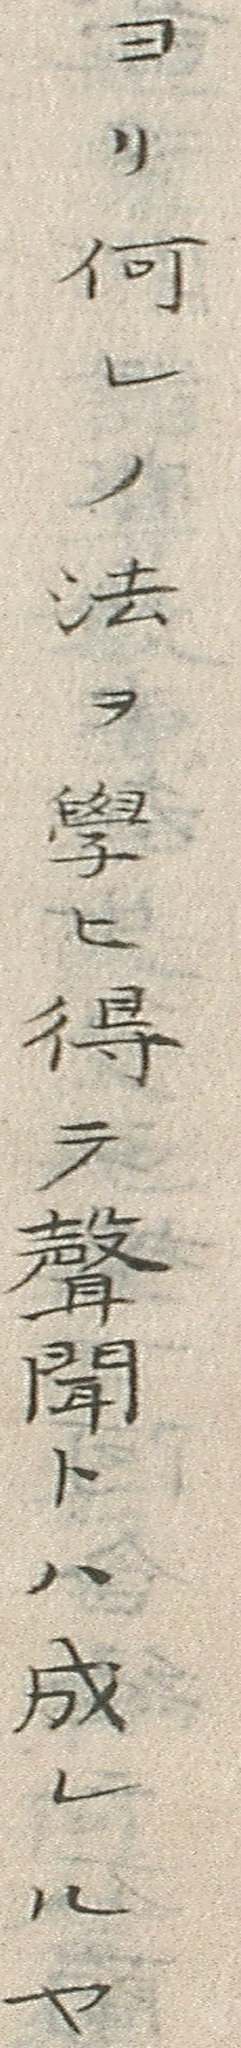ヨリ何レノ法ヲ学ヒ得テ声聞トハ成レルヤ
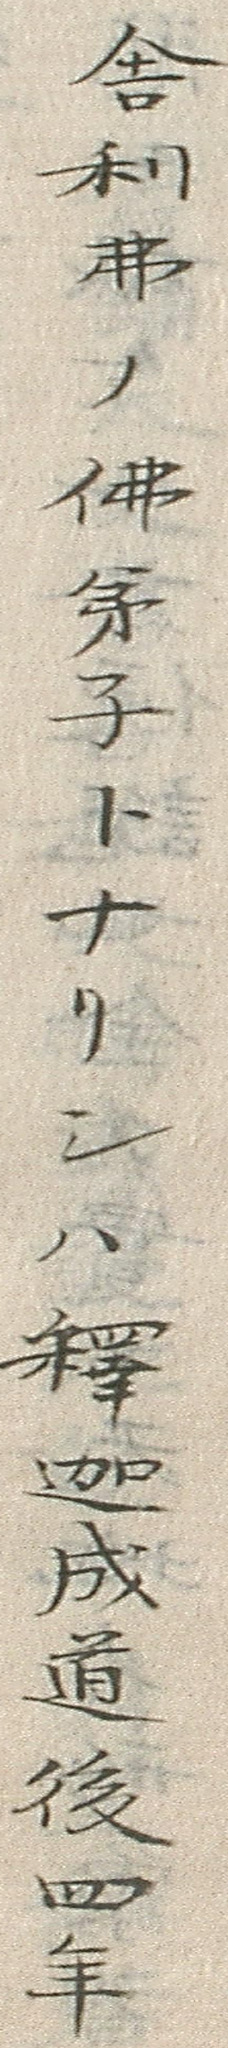舎利弗ノ仏弟子トナリシハ釈迦成道後四年
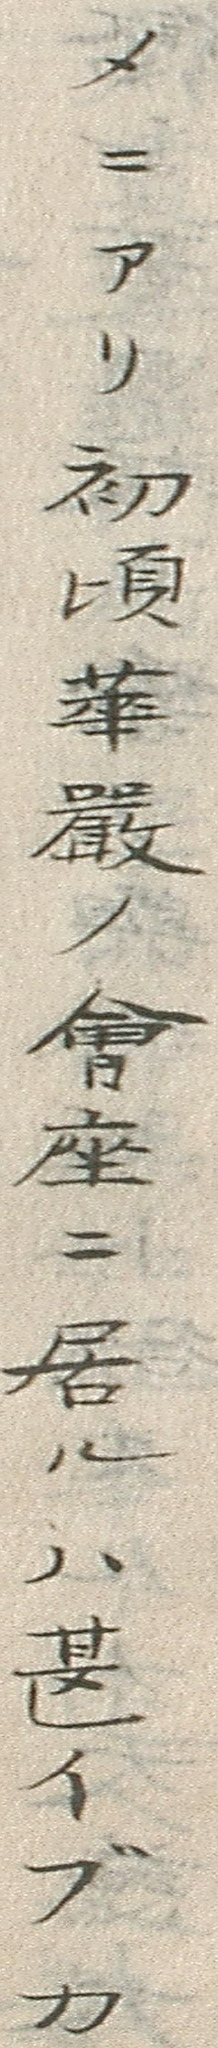メニアリ初頃華厳ノ会座ニ居ルハ甚イブカ
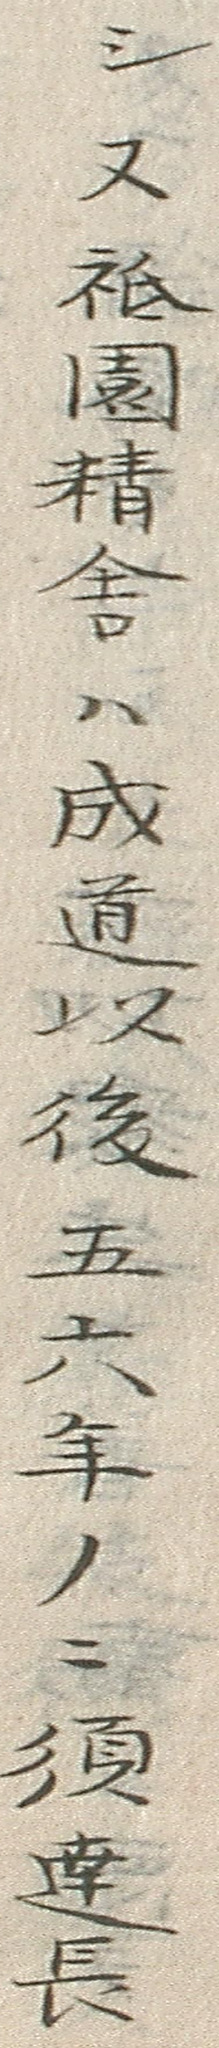シ又祇園精舎ハ成道以後五六年ノニ須達長
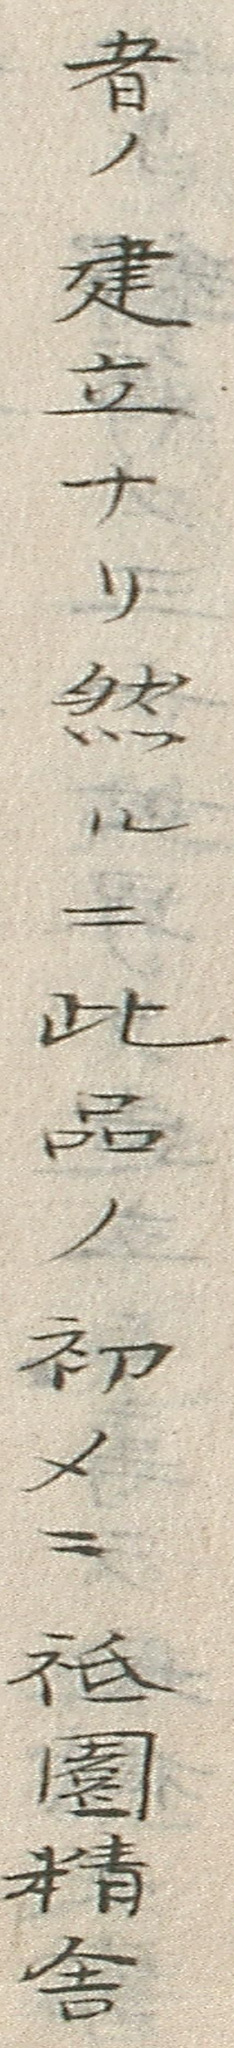者ノ建立ナリ然ルニ此品ノ初メニ祇園精舎
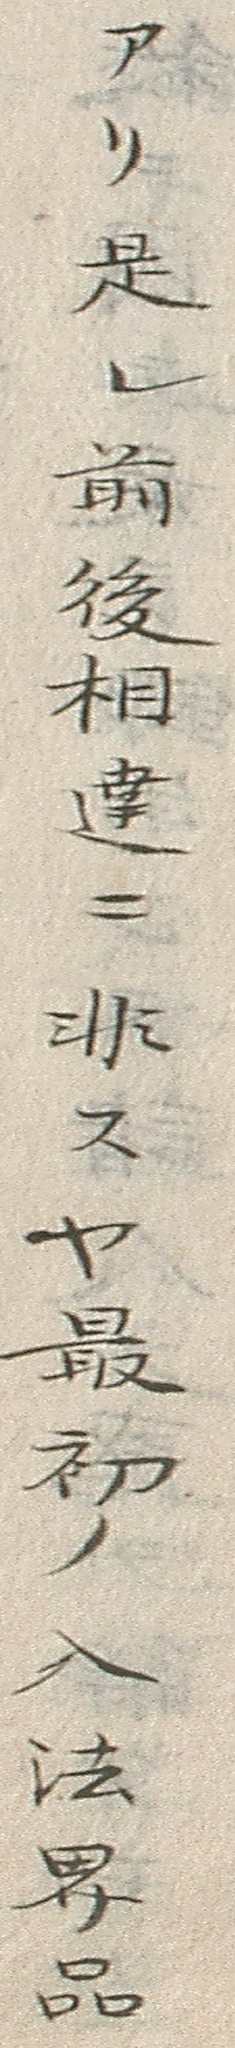アリ是レ前後相達ニ非スヤ最初ノ入法界品
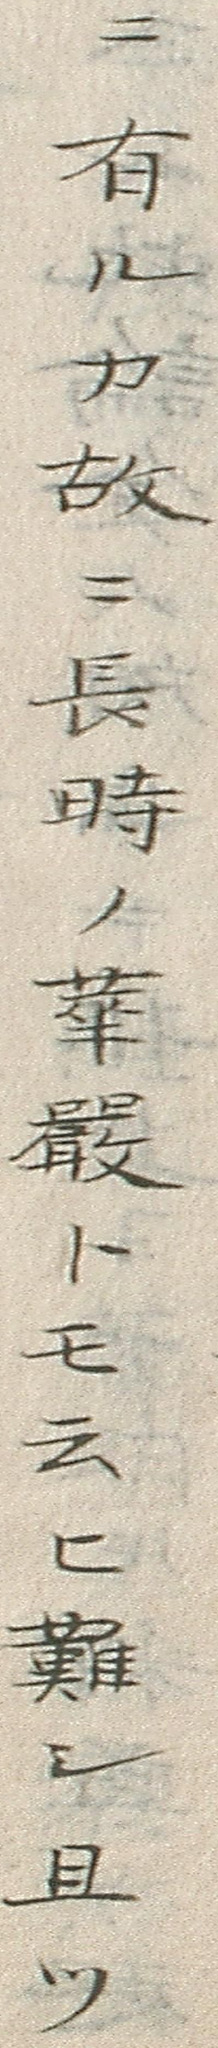ニ有ルカ故ニ長時ノ華厳トモ云ヒ難シ且ツ
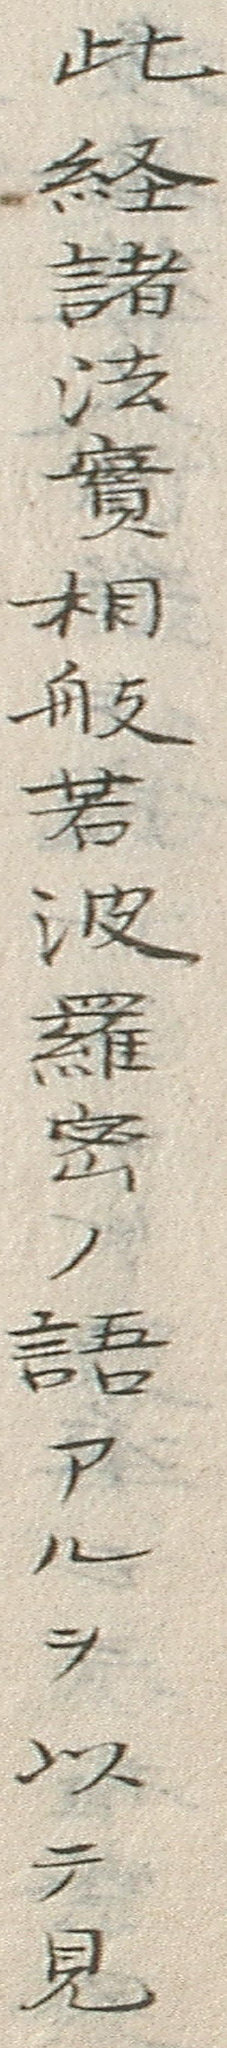此経諸法実相般若波羅密ノ語アルヲ以テ見
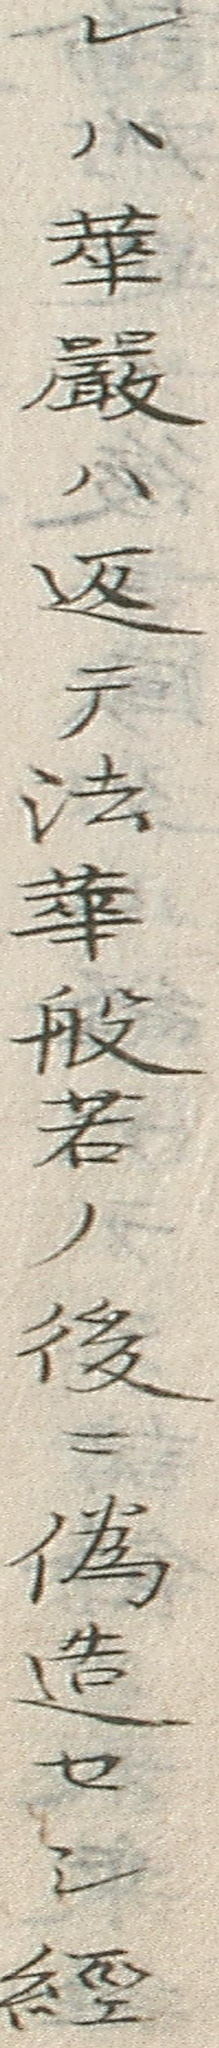レハ華厳ハ返テ法華般若ノ後ニ偽造セシ経
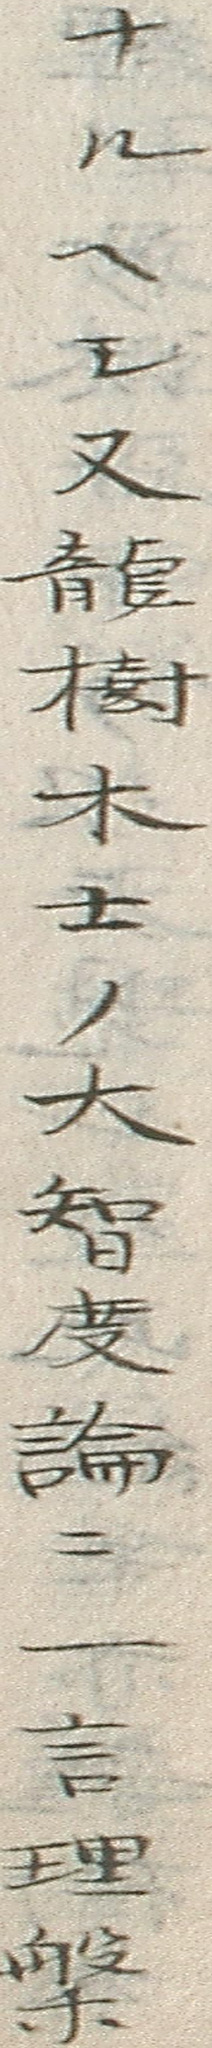ナルヘシ又龍樹木士ノ大智度論ニ一言理槃

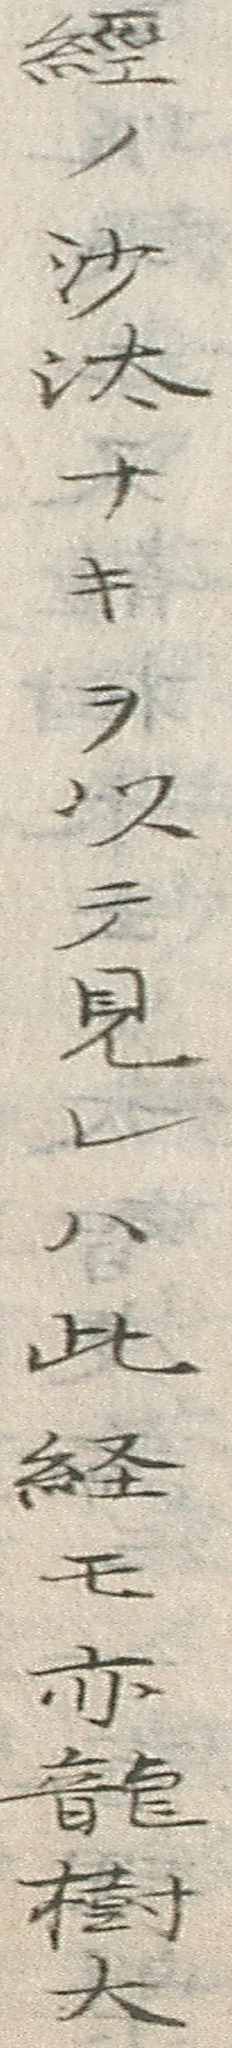経ノ沙汰ナキヲ以テ見レハ此経モ亦龍樹大
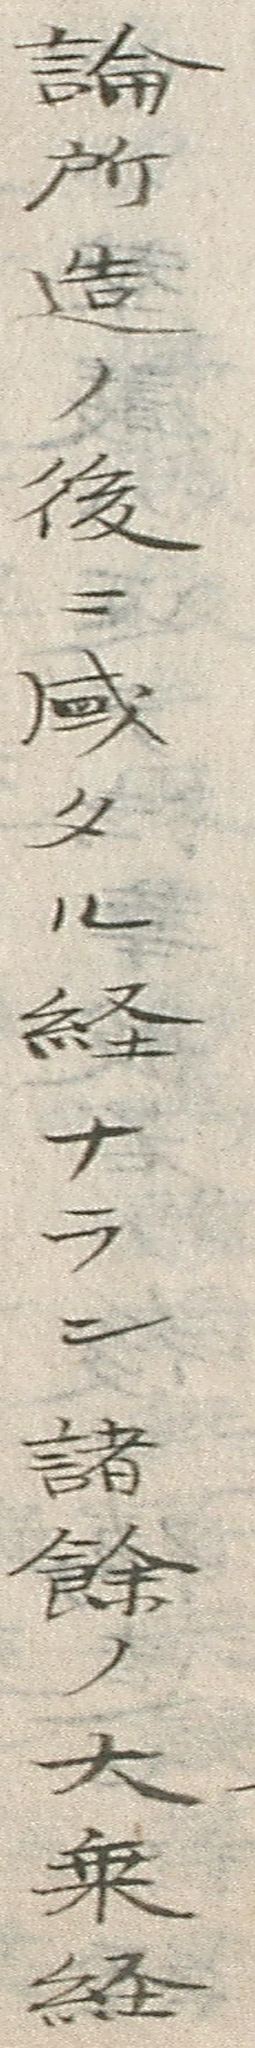論所造ノ後ニ咸タル経ナラン諸余ノ大乗経
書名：天學略名目羽翼　全
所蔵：東京大学地震研究所図書室 Earthquake Research Institute Library, The University of Tokyo, JAPAN
